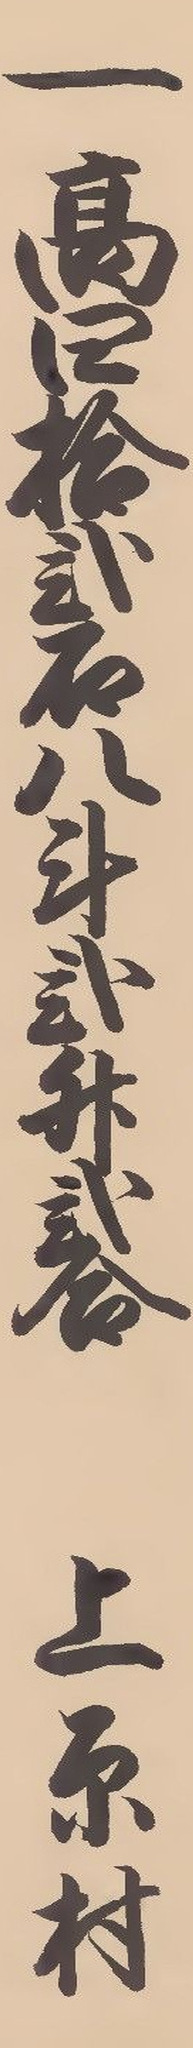一高四拾弐石八斗弐升弐合上原村
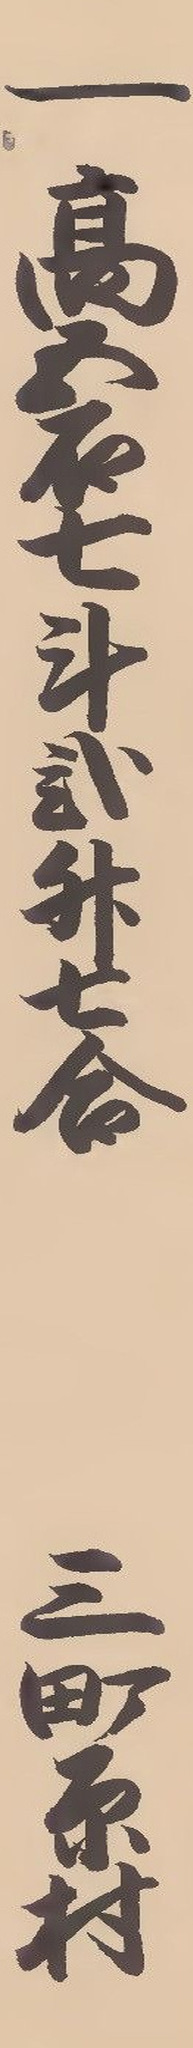一高五石七斗弐升七合三町原村
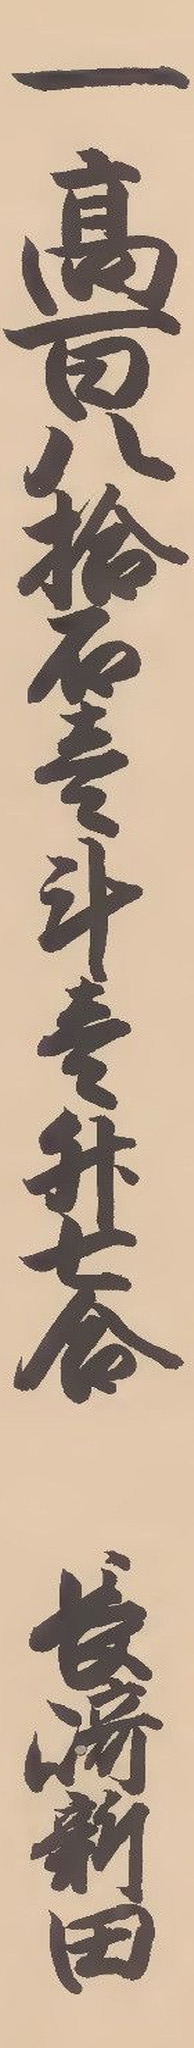一高百八拾石壱斗壱升七合長崎新田
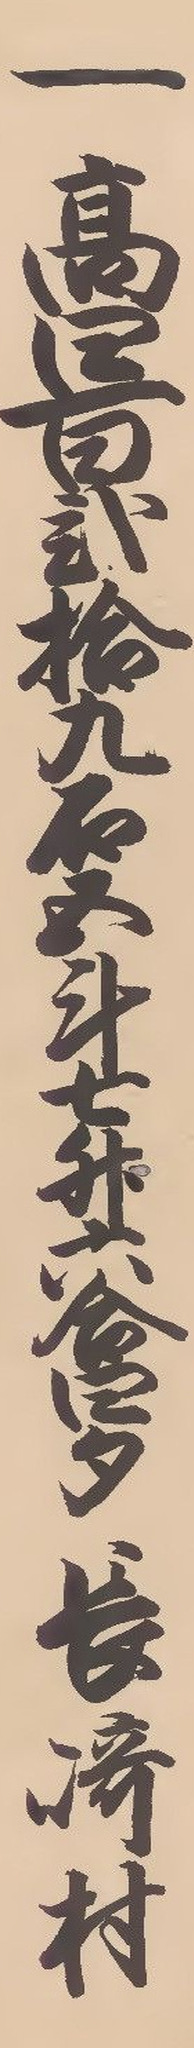一高四百弐拾九石五斗七升六合四勺長崎村

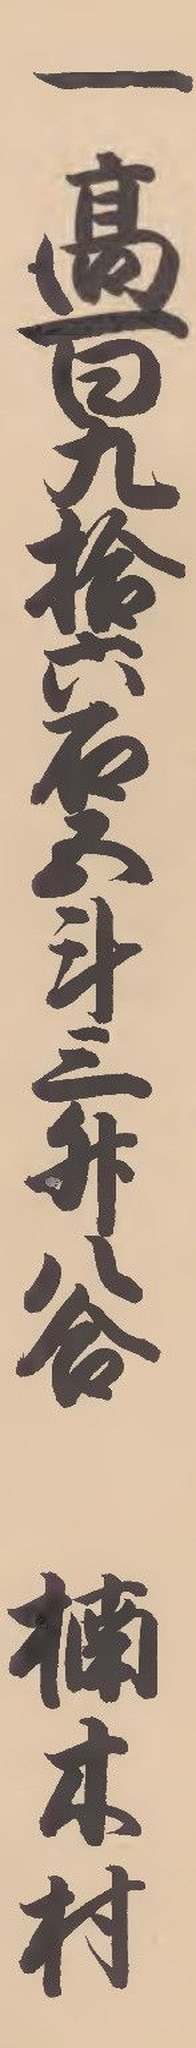一高百九拾六石五斗三升八合楠木村
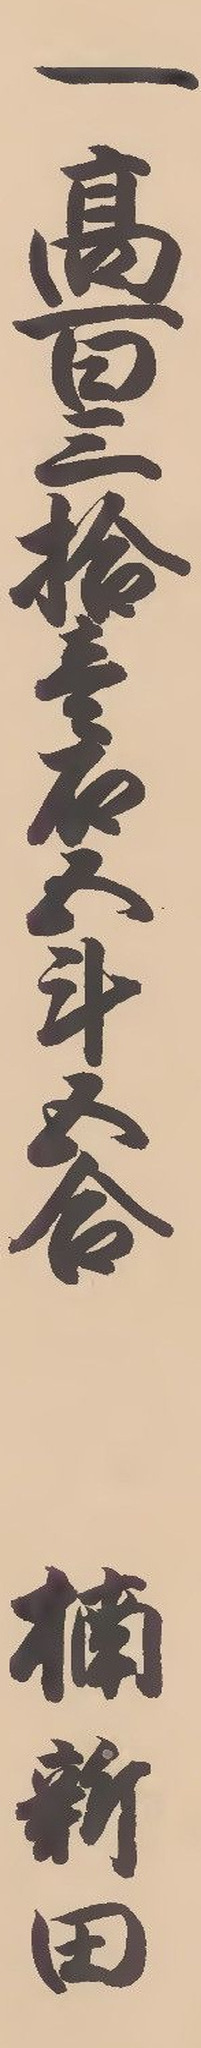一高百三拾壱石五斗五合楠新田
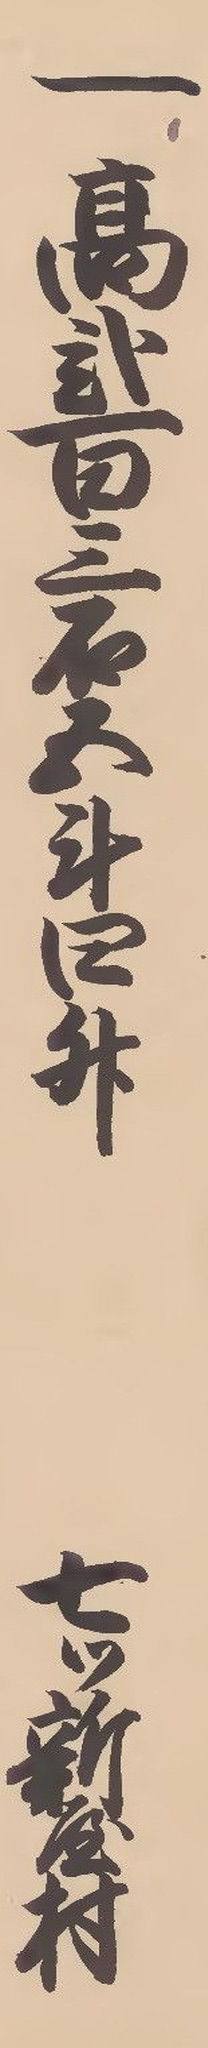一高弐百三石五斗四升七ツ新屋村
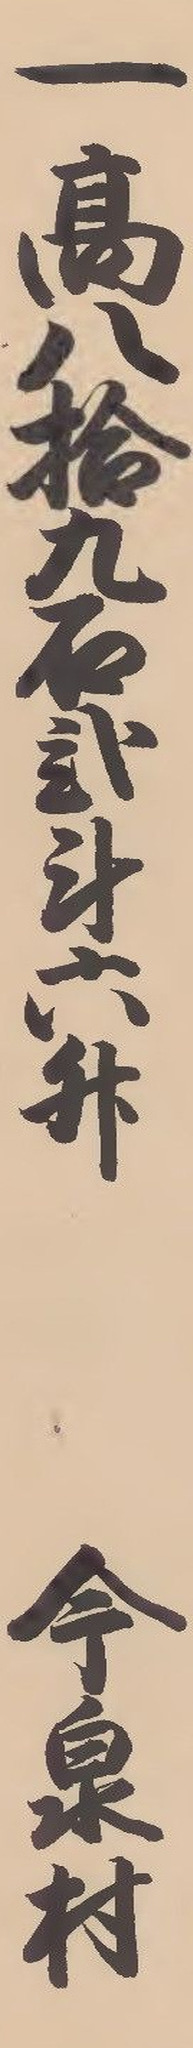一高八拾九石弐斗六升今泉村
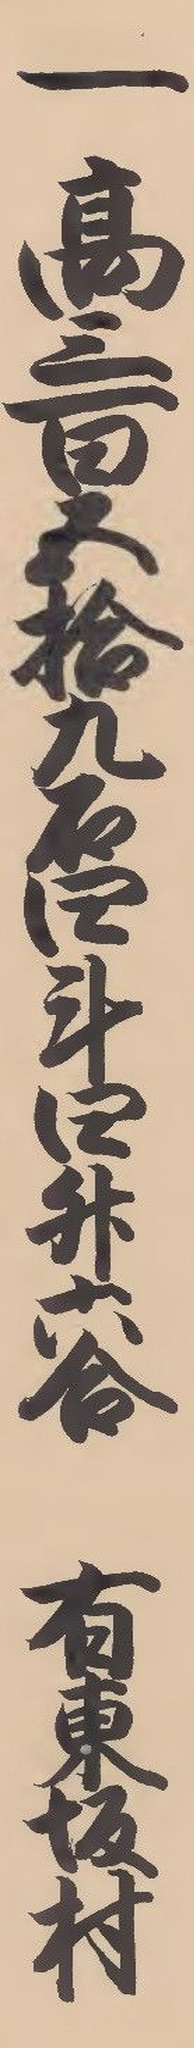一高三百五拾九石四斗四升六合有東坂村
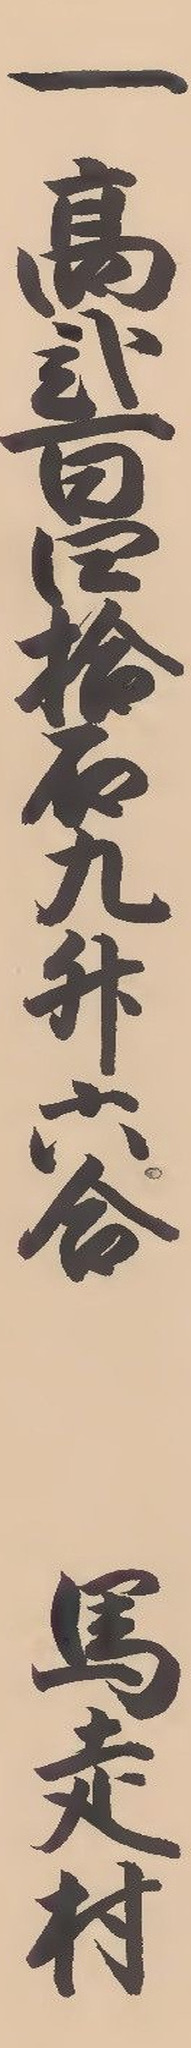一高弐百四拾石九升六合馬走村

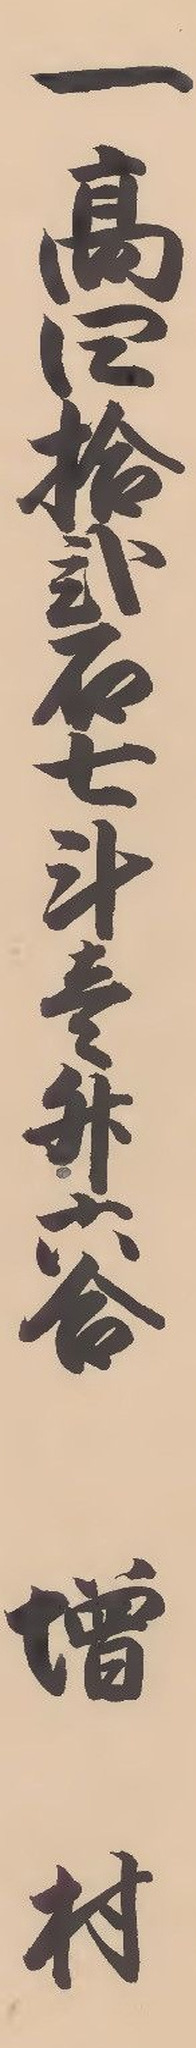一高四拾弐石七斗壱升六合増村
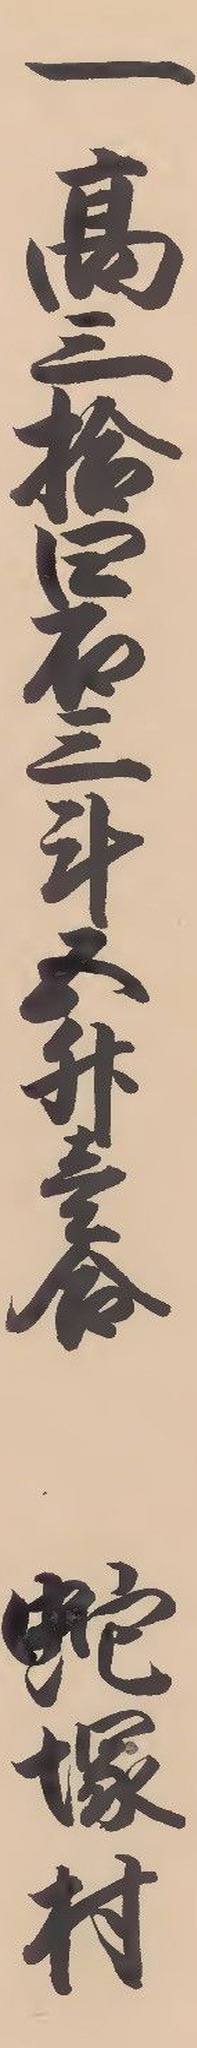一高三拾四石三斗五升壱合蛇塚村
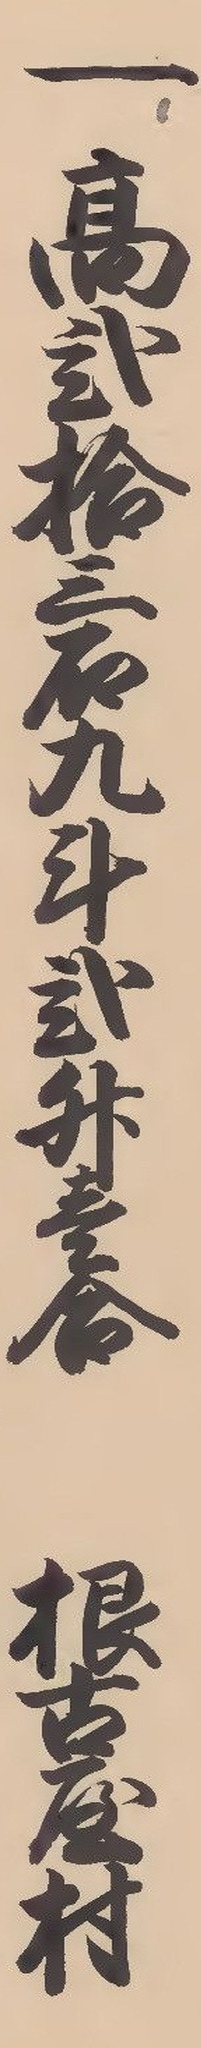一高弐拾三石九斗弐升壱合根古屋村
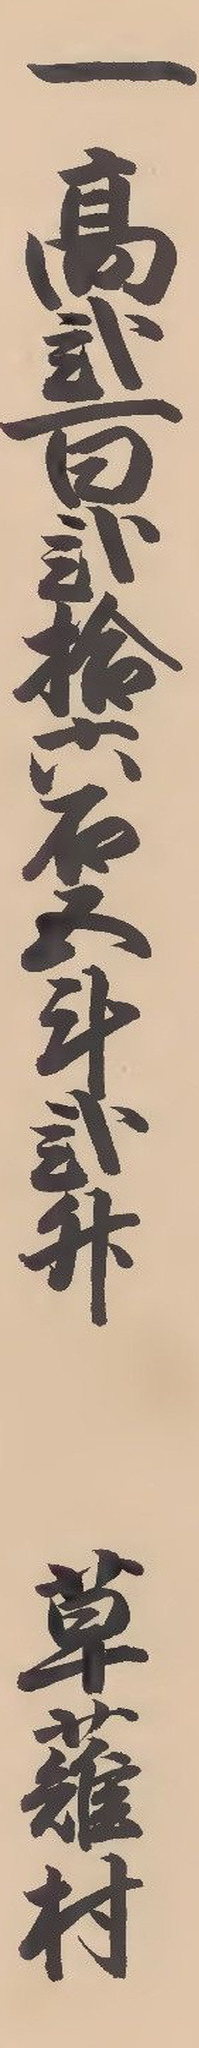一高弐百弐拾六石五斗弐升草薙村
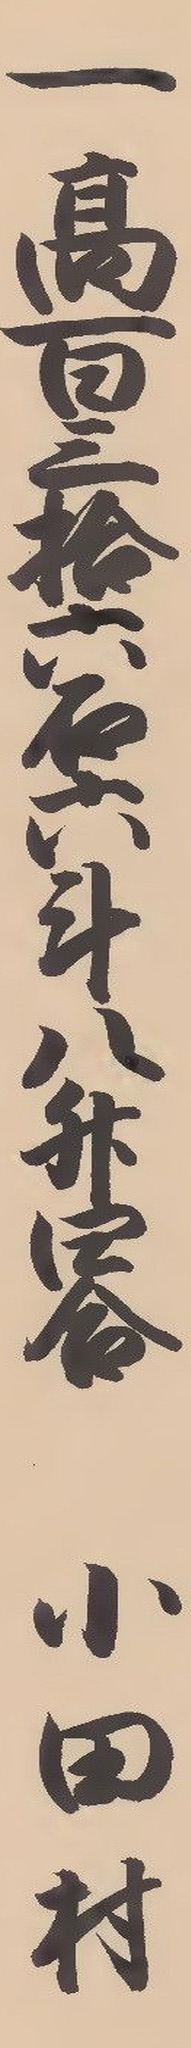一高百三拾六石六斗八升四合小田村
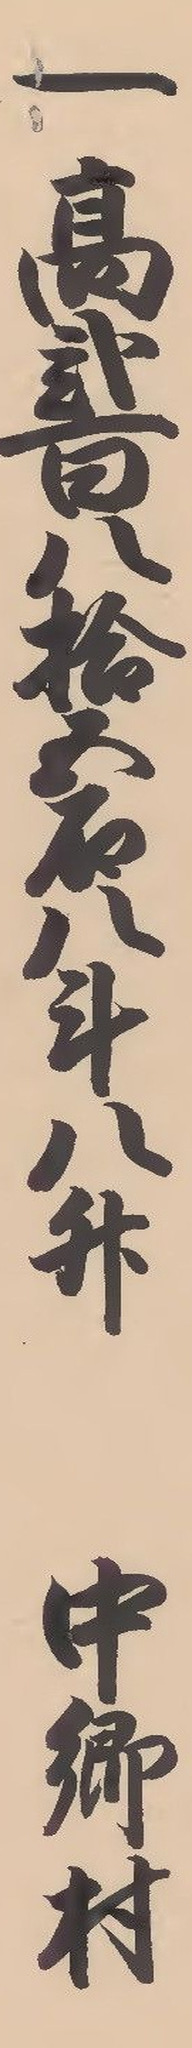一高弐百八拾五石八斗八升中郷村
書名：駿河国郷帳
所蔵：国立公文書館 National Archives of Japan
